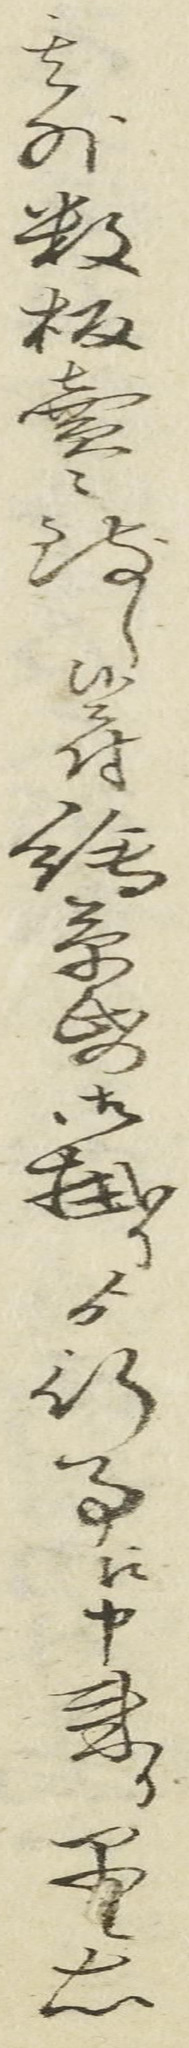其外数板売ニ致し候ニ付絵草紙御掛りゟ行事え申来り早々右
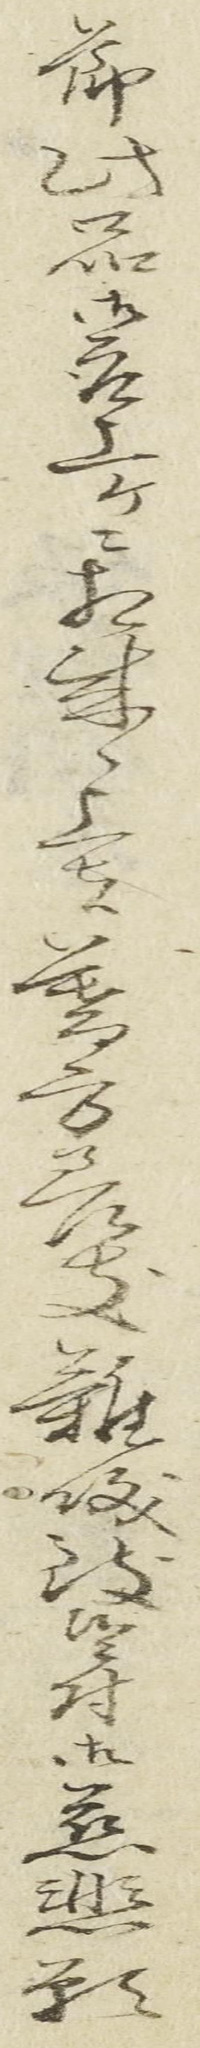板木摺溜共取上ケニ相成候上は暮方差支難儀致候ニ付御慈悲願
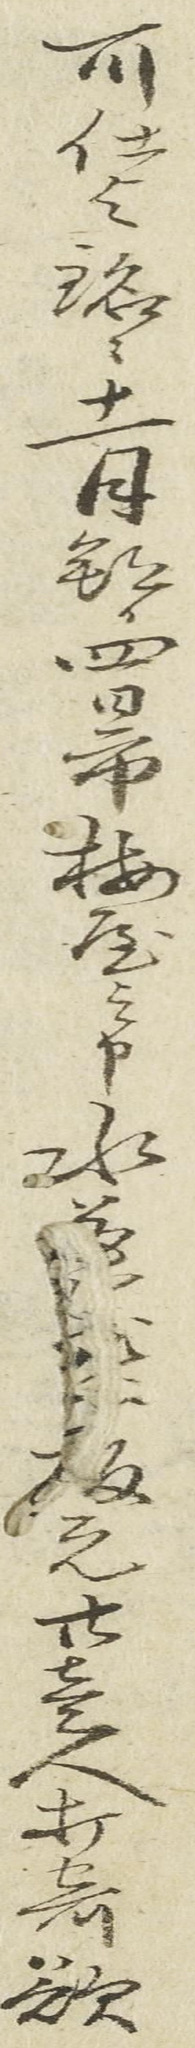可仕と銘々十一月朔日四日市梅屋と申水板元廿壱打寄歎
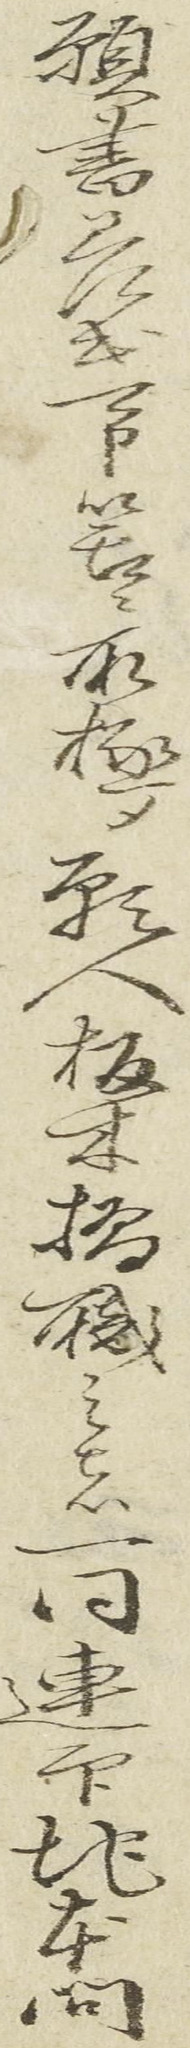願書差出可申筈ニ取極メ願人板木摺職之者一同連印地本問
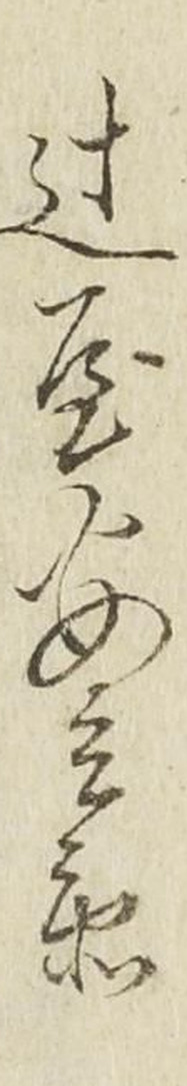辻屋安兵衛
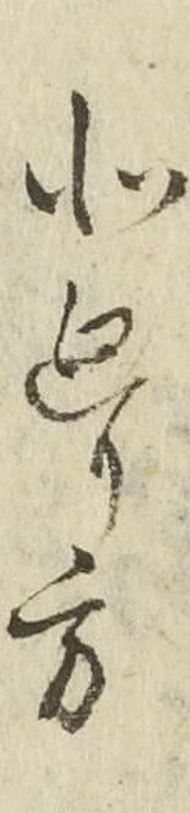北廻り方
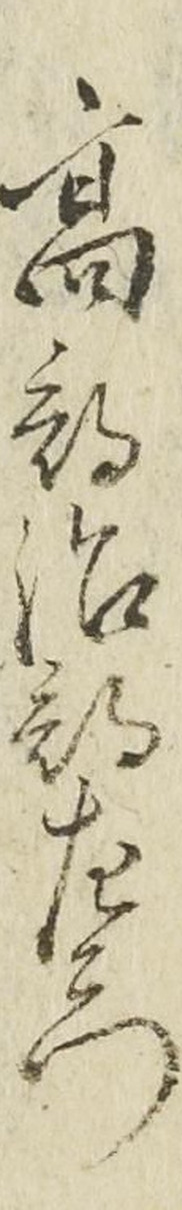高部治部左衛門
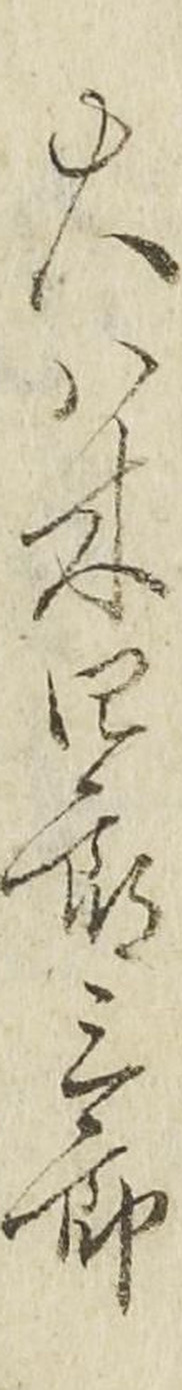大米四郎三郎
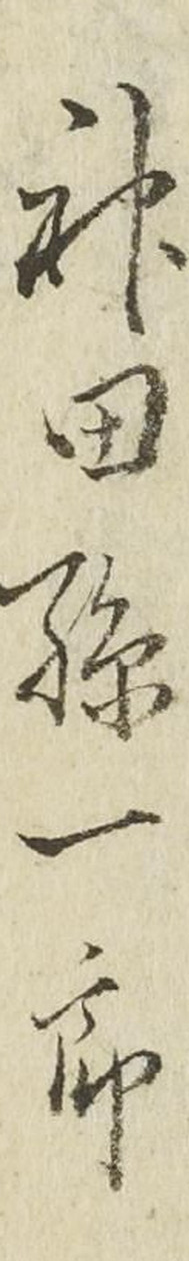神田孫一郎
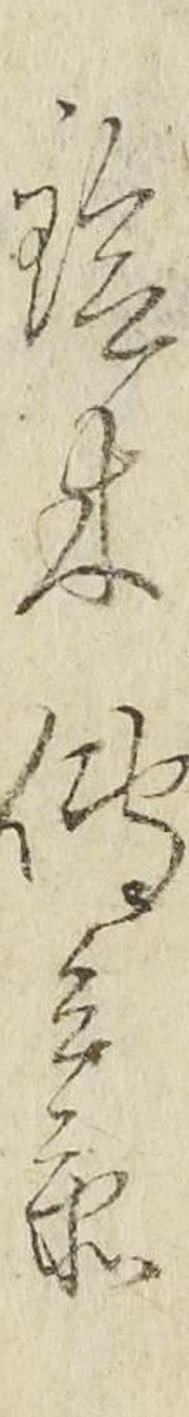鈴木伝兵衛
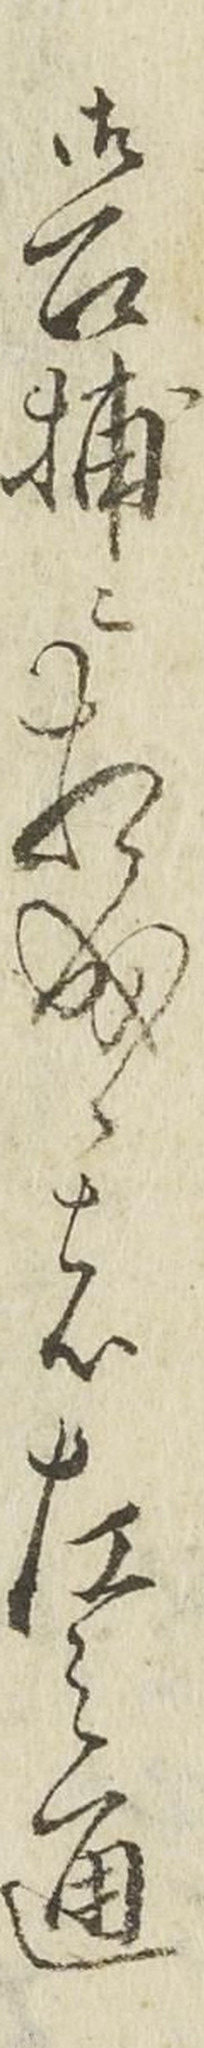御召捕ニ相成候者左之通
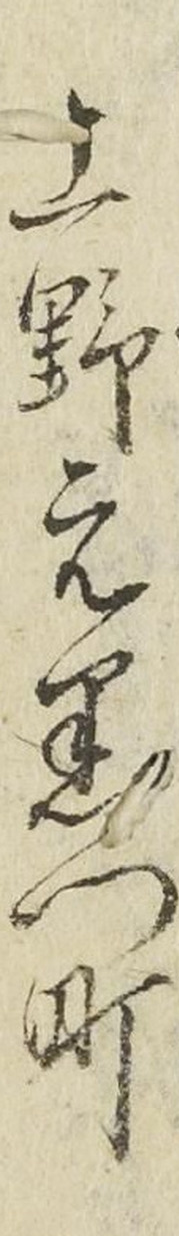上野元黒門町

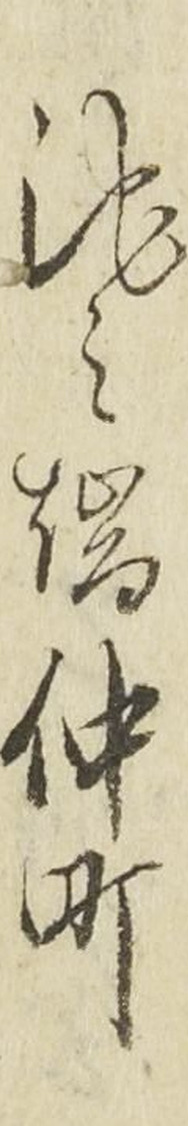池之端仲町
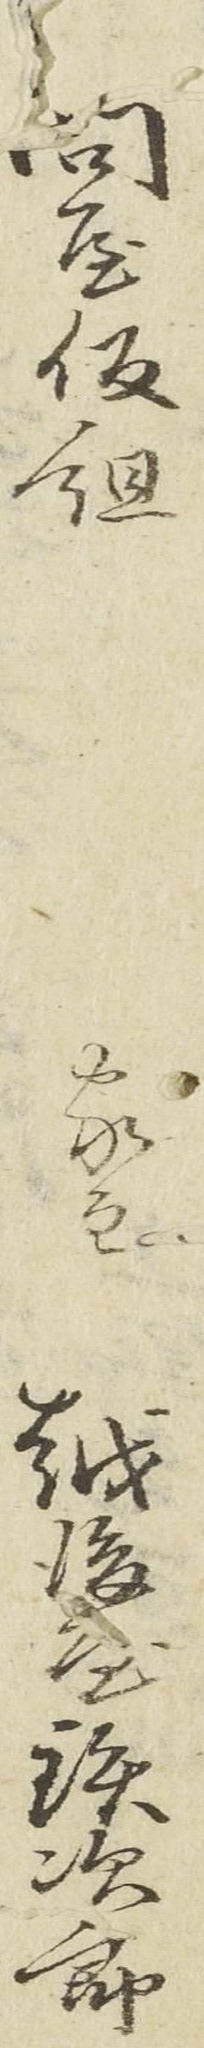問屋仮組家主越後屋鉄次郎
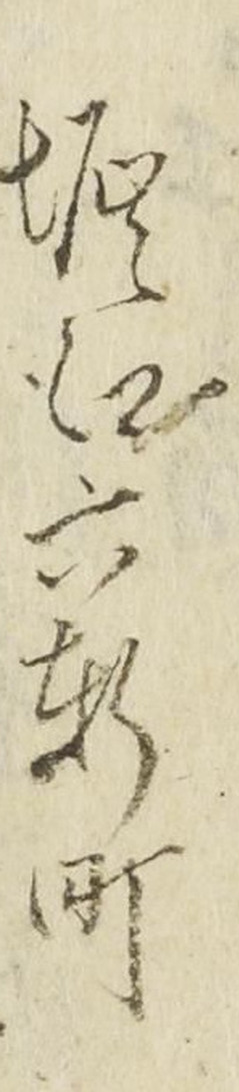堀江六軒町
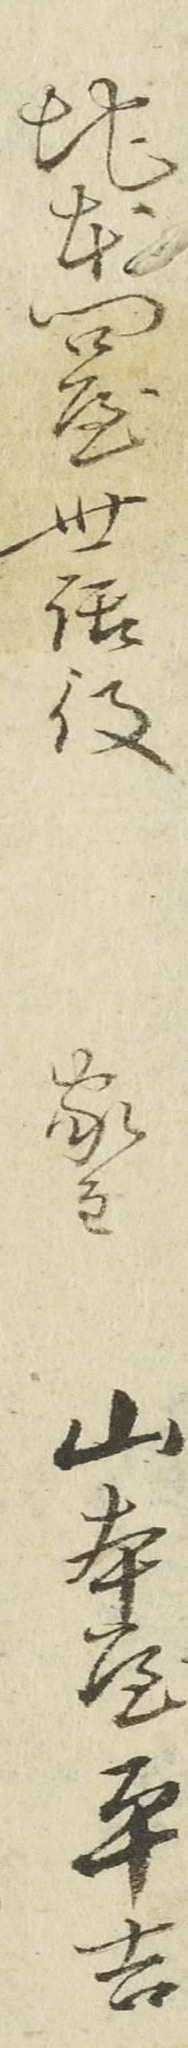地本問屋世話役家主山本屋平吉
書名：安政二乙卯年十月二日大地震之事
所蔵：東京大学地震研究所図書室 Earthquake Research Institute Library, The University of Tokyo, JAPAN
